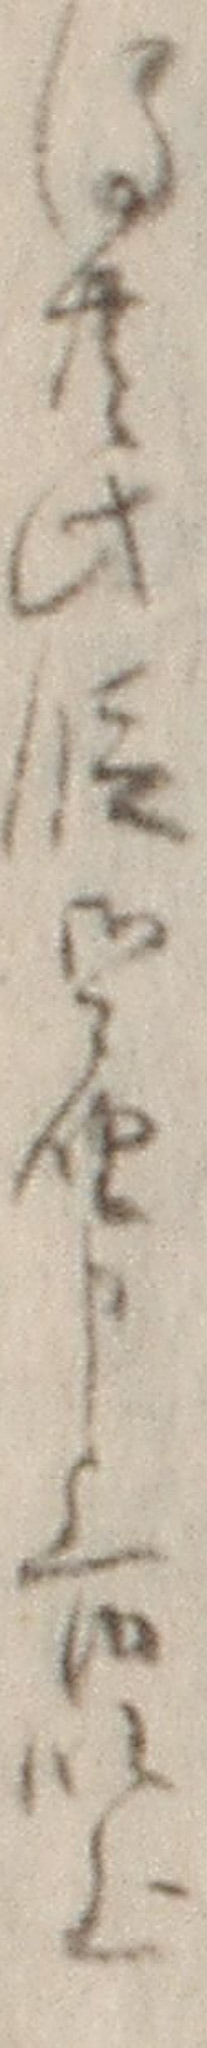得共此段御届申上候以上
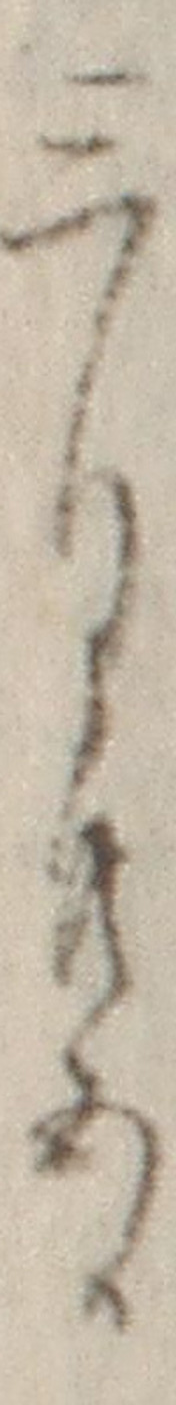三月廿五日
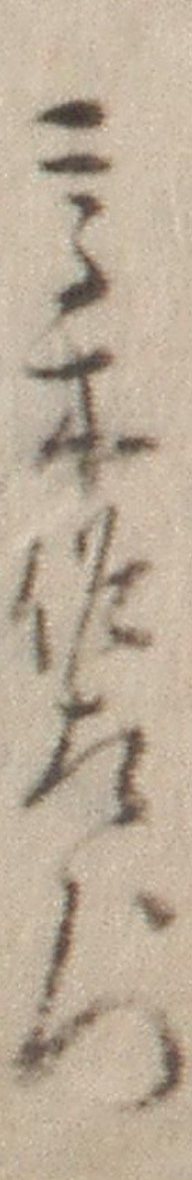高木作左衛門

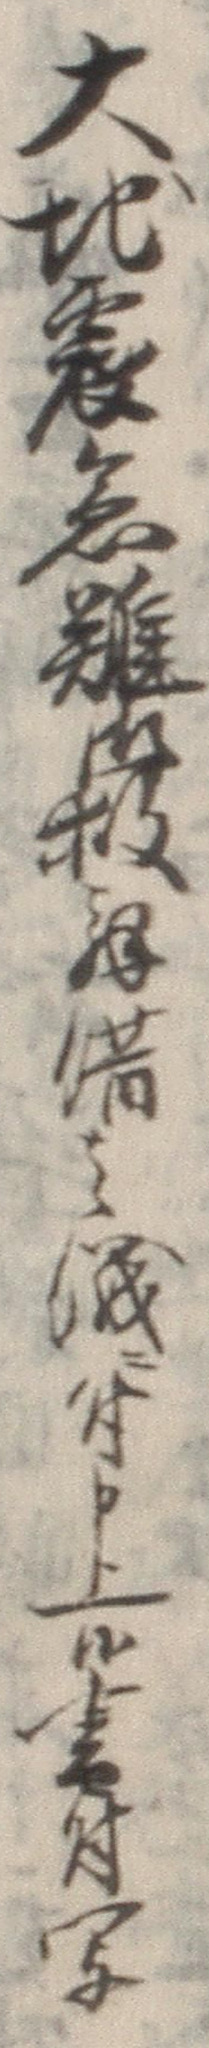大地震急難御救拝借之議ニ付申上候書付写
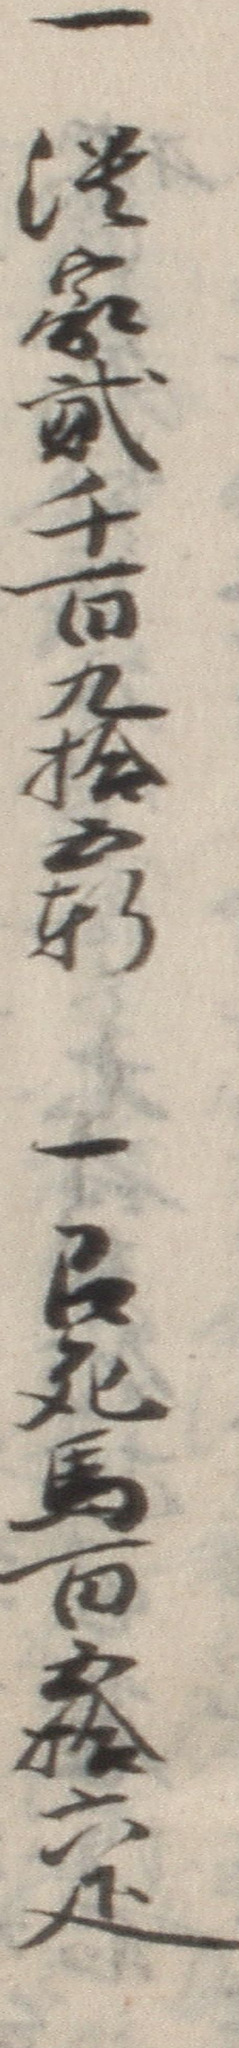一潰家弐千百九拾五軒一即死馬百五拾六疋
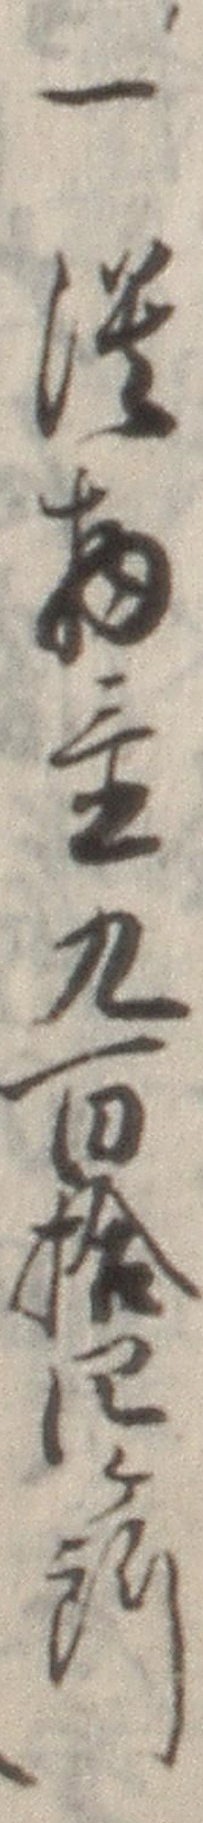一潰物置九百拾四ヶ所
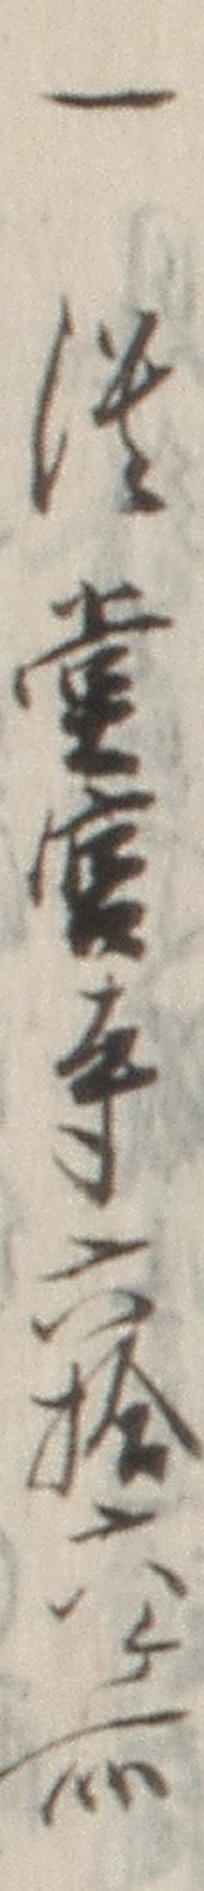一潰堂宮寺六拾六ヶ所
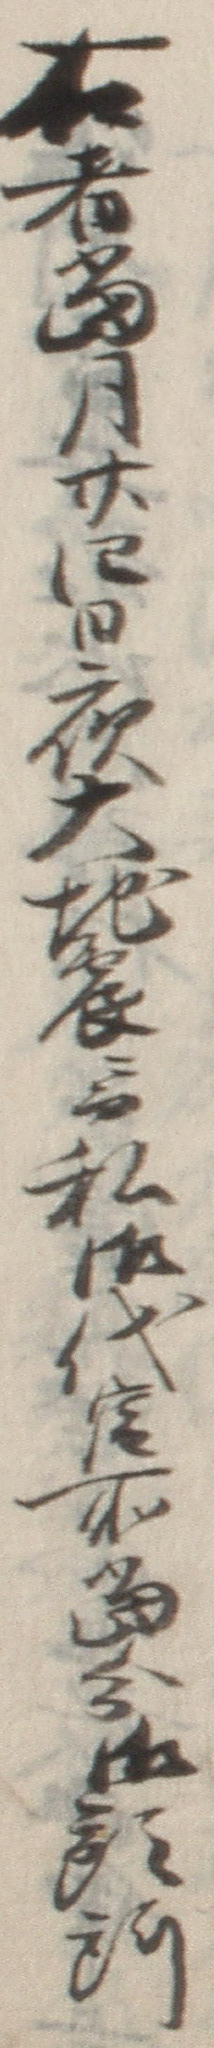右者当月廿四日夜大地震ニ而私御代官所当分御預所

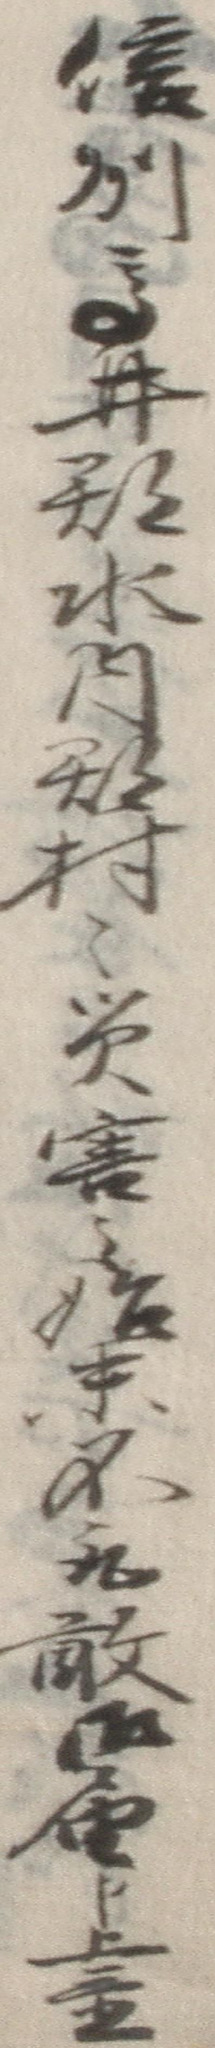信州高井郡水内郡村々災害之始末不取敢御届申上置
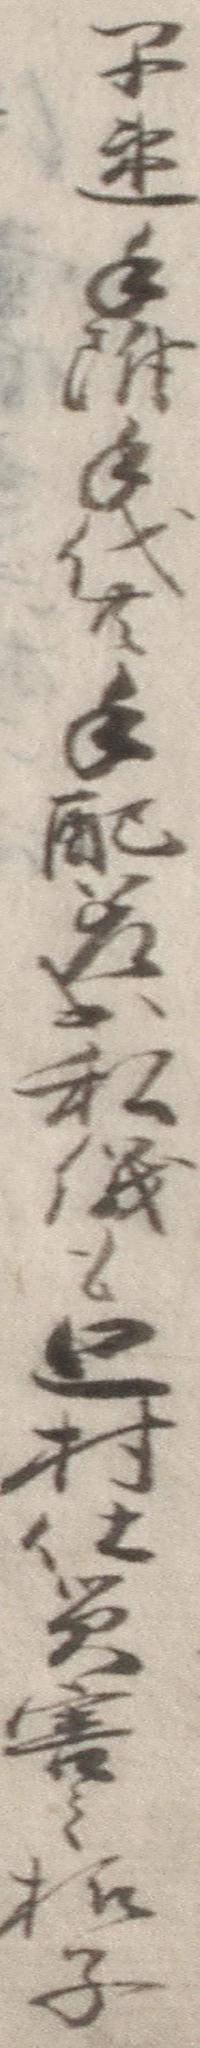早速手附手代共手配差出私儀も廻村仕災害之様子
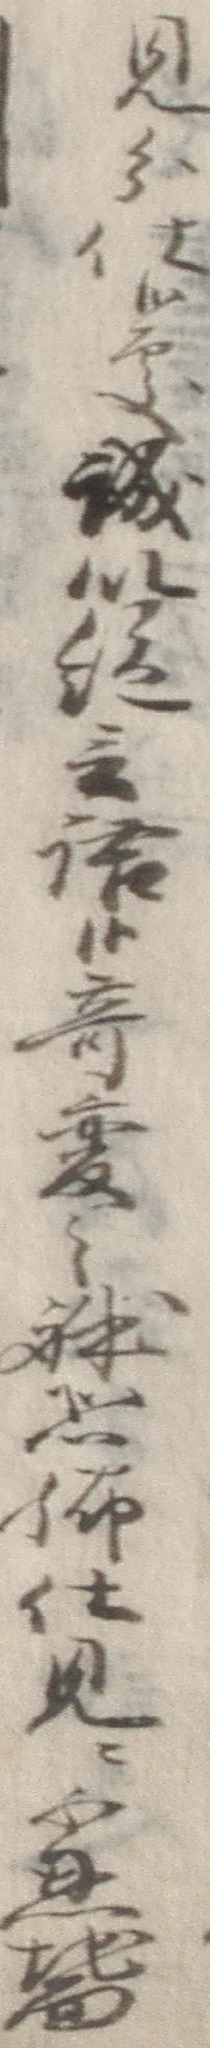見分仕候處誠以絶言語候奇変之躰恐怖仕見ニ不忍地面
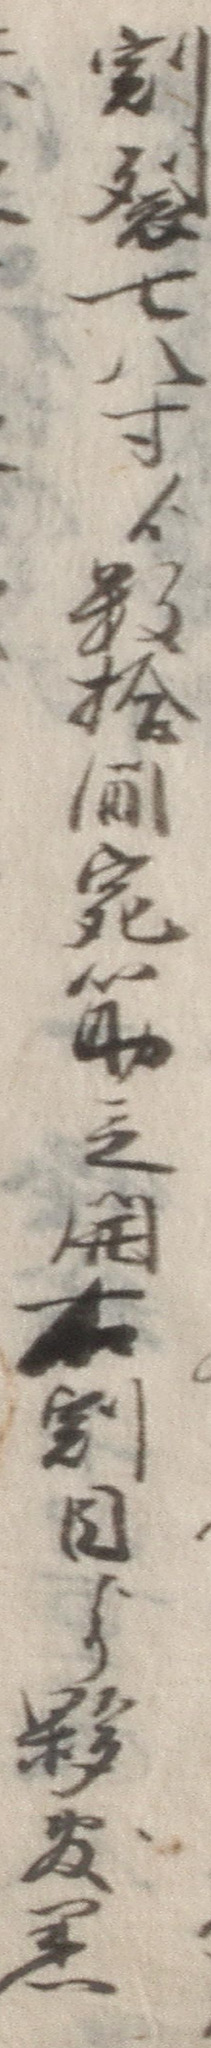割裂七八寸ゟ数拾間宛筋之開右割目より夥敷黒
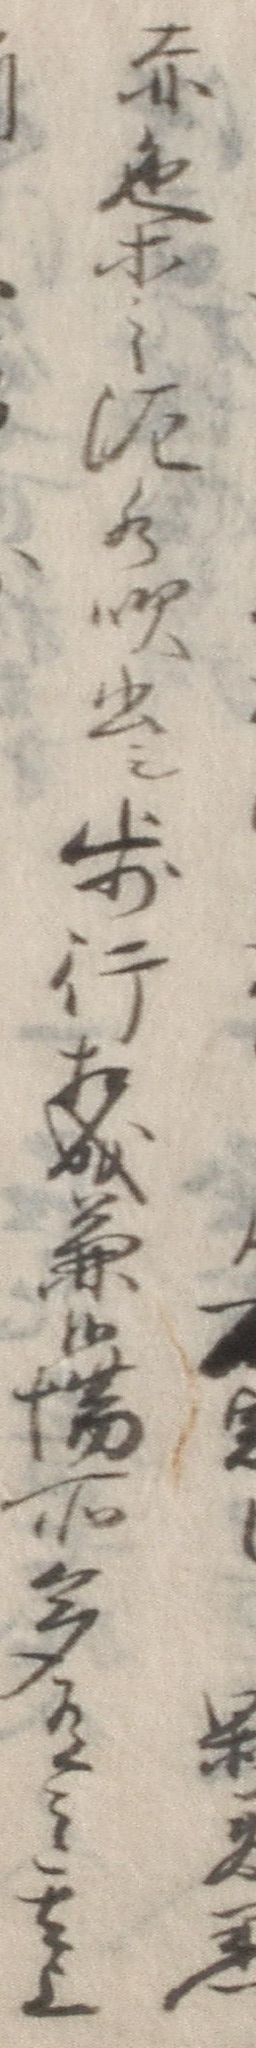赤色等之泥水吹出シ歩行相成兼候場所多有之其上
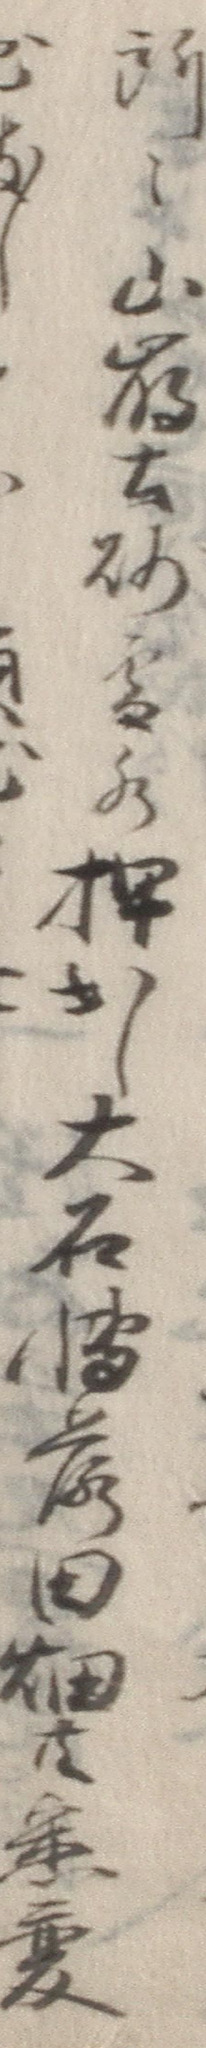所々山崩土砂雪水押出し大石轉落田畑共悉変
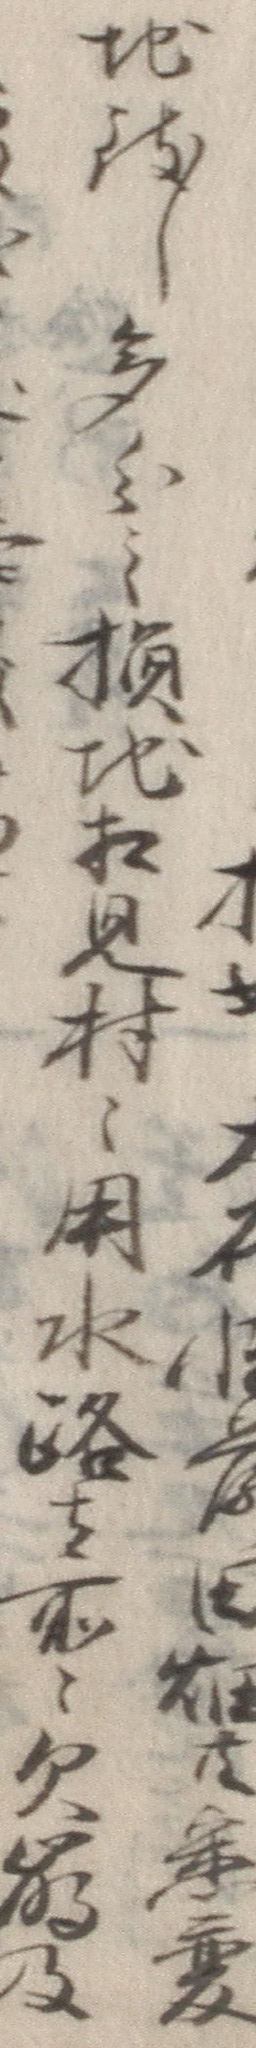地致し多分之損地相見村々用水路は所々欠崩及
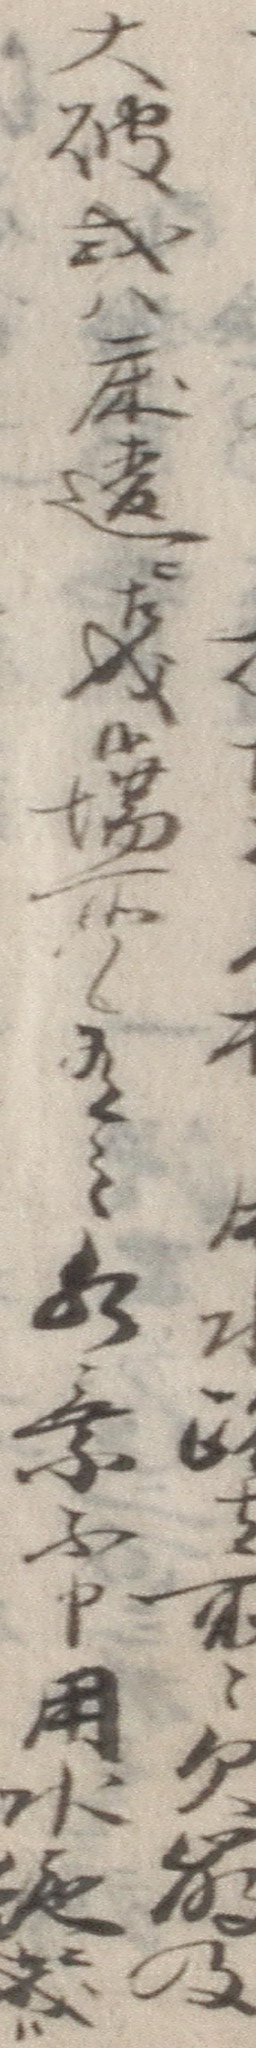大破或ハ床違ニ相成候場所も有之水乗不申用水絶ニ相成候
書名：[善光寺地震に関する冊子]
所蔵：東京大学地震研究所図書室 Earthquake Research Institute Library, The University of Tokyo, JAPAN
